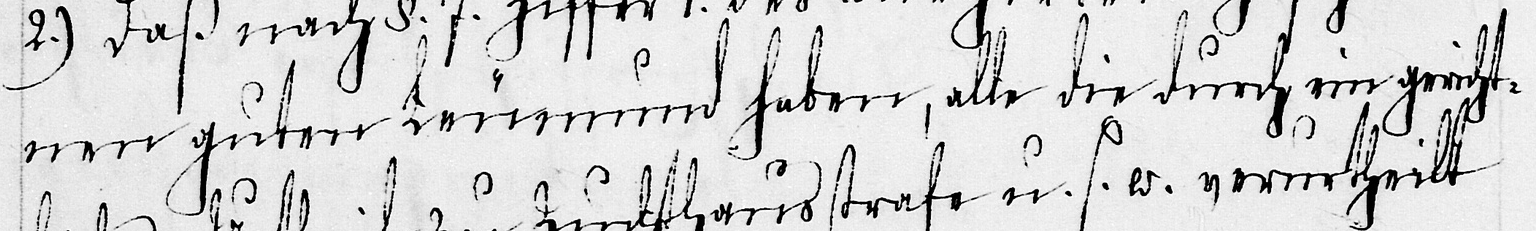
nen guten Leumund haben, alle die durch ein gericht¬
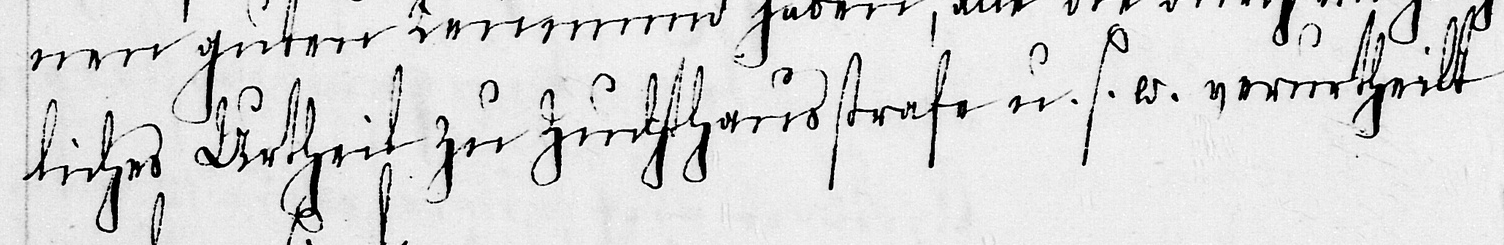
liches Urtheil zu Zuchthausstrafe u. s. w. verurtheilt
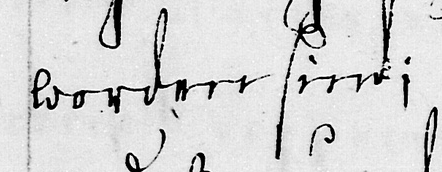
worden sind;
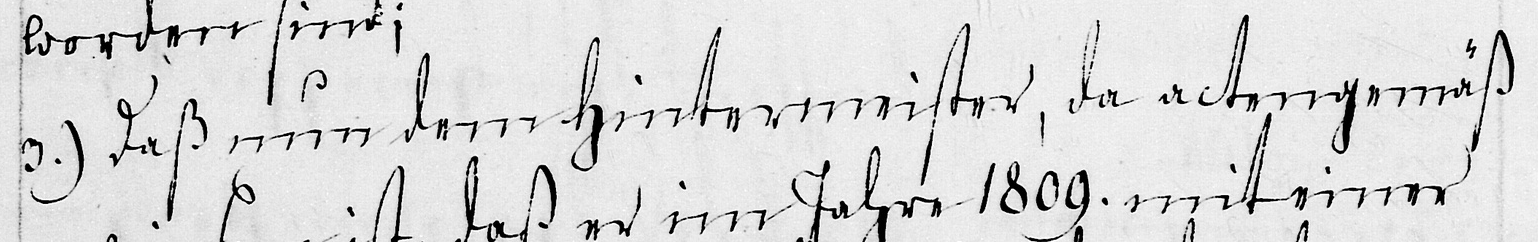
3.) Daß nun dem Hintermeister, da actengemäß
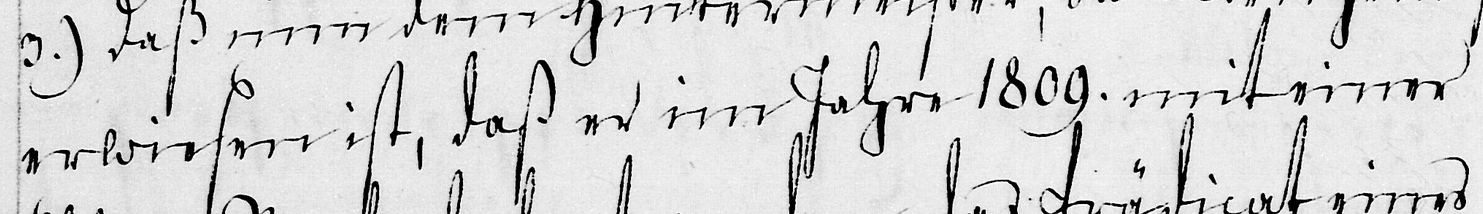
erwiesen ist, daß er im Jahre 1809. mit einer
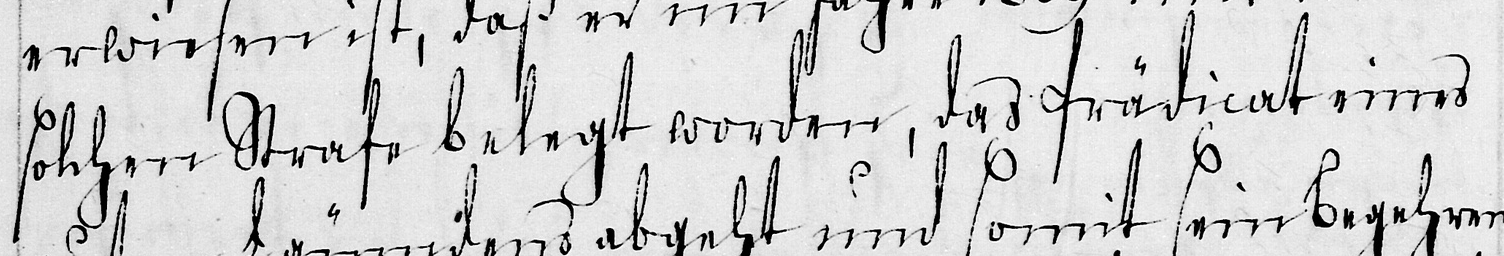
solchen Strafe belegt worden, das Prädicat eines
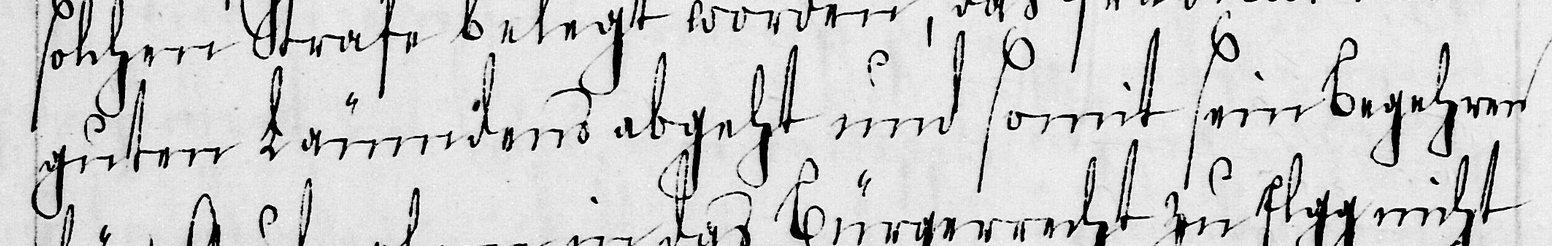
guten Läumdens abgeht und somit sein Begehren
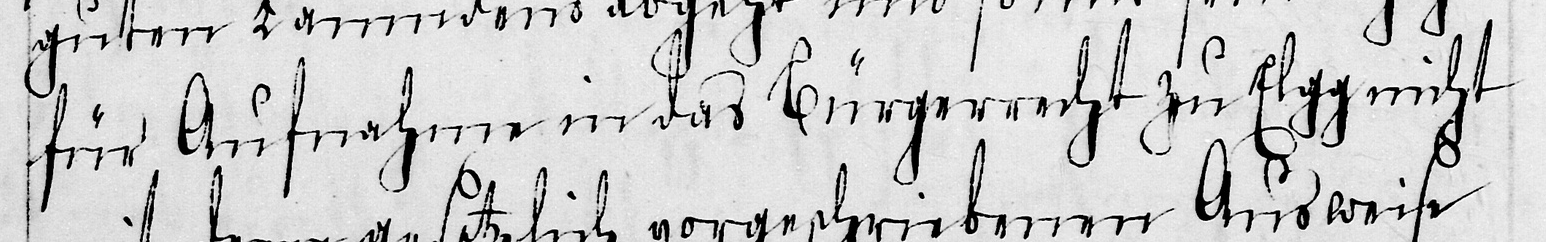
für Aufnahme in das Bürgerrecht zu Elgg nicht
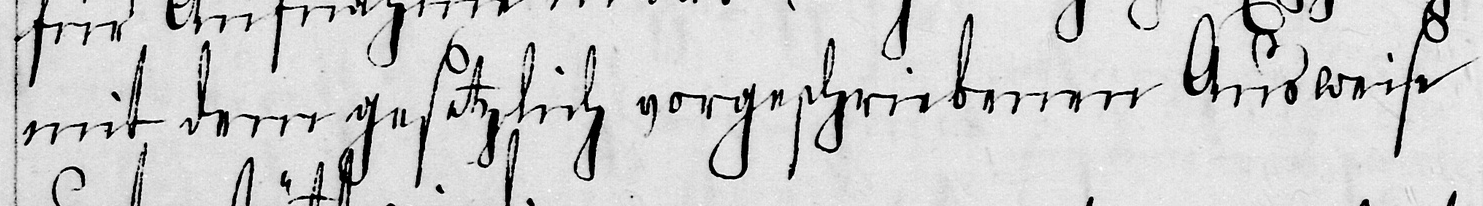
mit dem gesetzlich vorgeschriebenen Ausweise
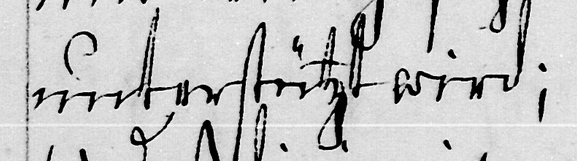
unterstützt wird;
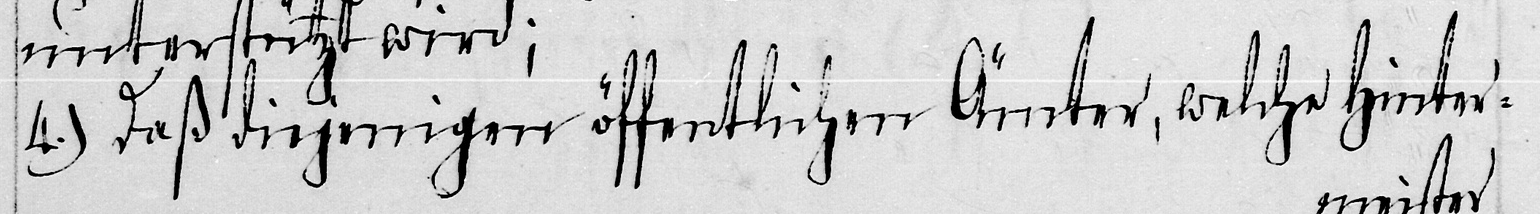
4.) Daß diejenigen öffentlichen Ämter, welche Hinter-
